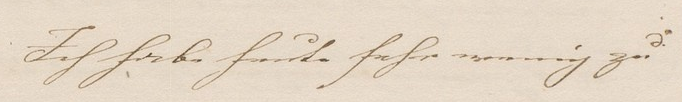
Ich habe heute sehr wenig zu
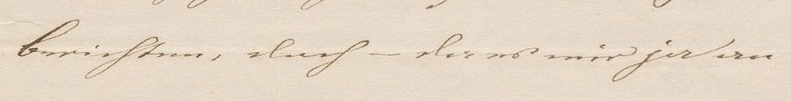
berichten, doch – da es mir ja an
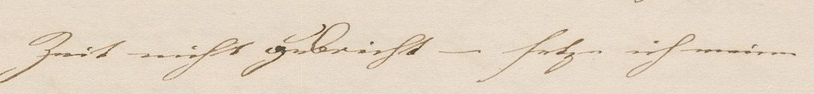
Zeit nicht gebricht – setze ich meine
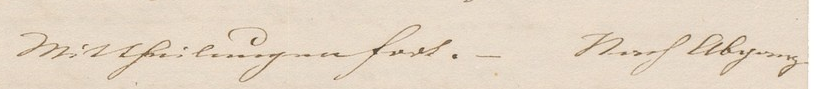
Mittheilungen fort. – Nach Abgang
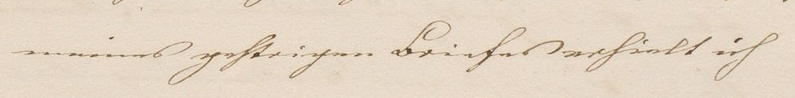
meines gestrigen Briefes erhielt ich
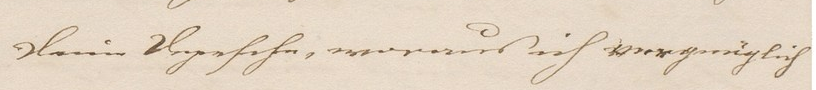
Deine Depesche, woraus ich vergnüglich
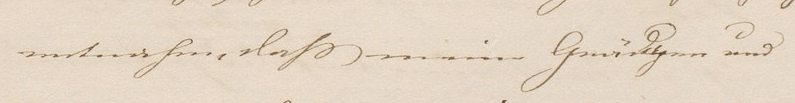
entnahm, daß meine Gnädigen und
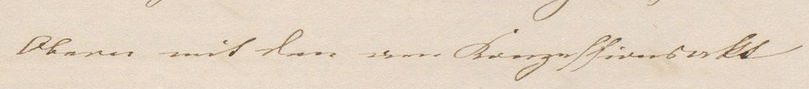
Obern mit den am Konzessionsakt
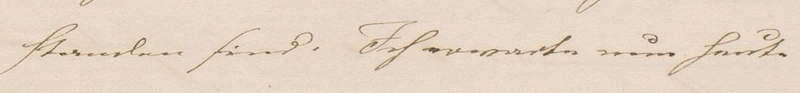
standen sind. Ich erwarte nun heute
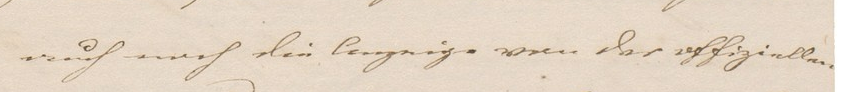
auch noch die Anzeige von der offiziellen
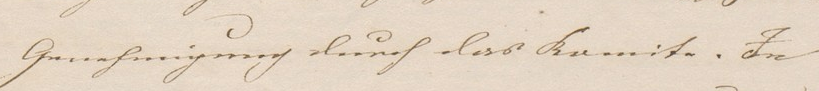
Genehmigung durch das Komite. In
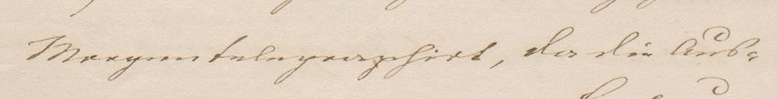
Morgen telegraphirt, da die Aus-
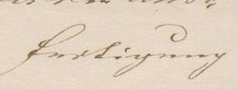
fertigung
